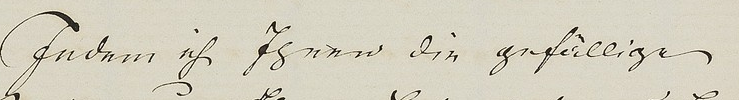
Indem ich Ihnen die gefällige
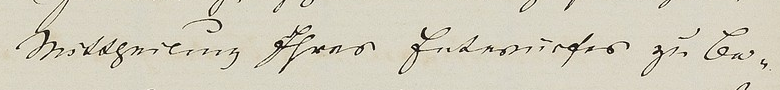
Mittheilung Ihres Entwurfes zu Be-
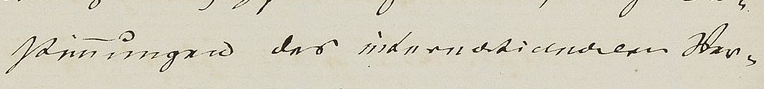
stimmungen des internationalen Ver-
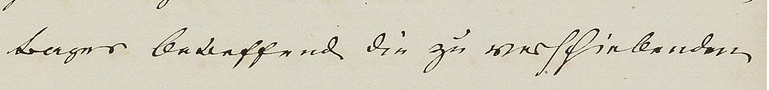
trages betreffend die zu verschiebenden
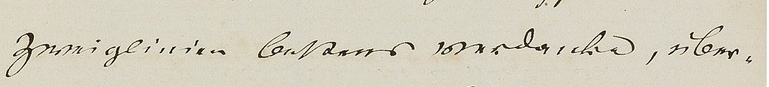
Zweiglinien bestens verdanke, über-
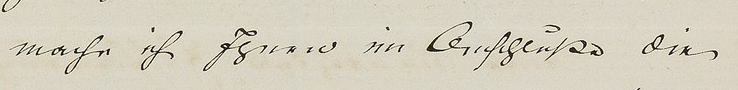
mache ich Ihnen im Anschluße die
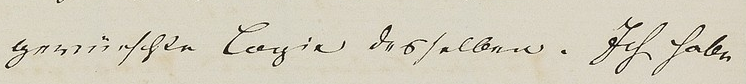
gewünschte Copie desselben. Ich habe
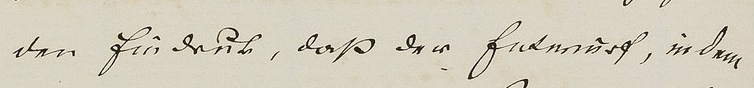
den Eindruk, daß der Entwurf, in dem
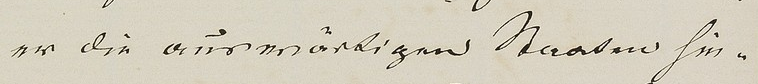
er die auswärtigen Staaten hin-
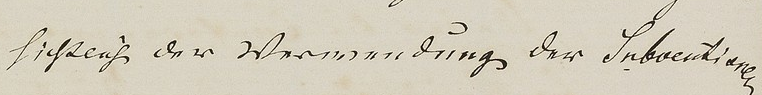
sichtlich der Verwendung der Subventionen
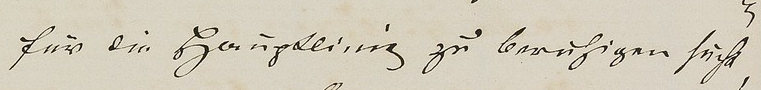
für die Hauptlinie zu beruhigen sucht,
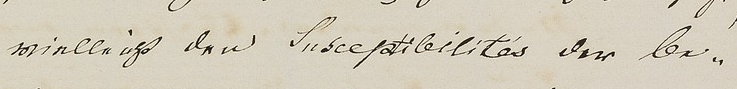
vielleicht den Susceptibilités der be-
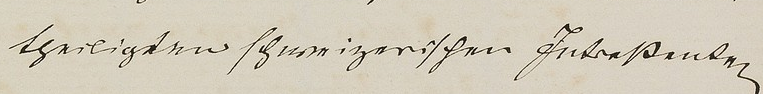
theiligten schweizerischen Intreßenten
